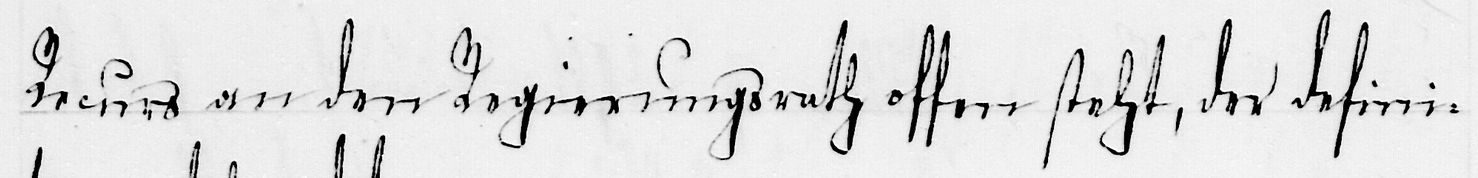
Recurs an den Regierungsrath offen steht, der defini¬
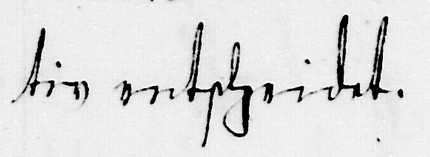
tiv entscheidet.
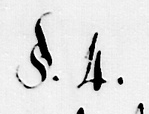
§. 4.
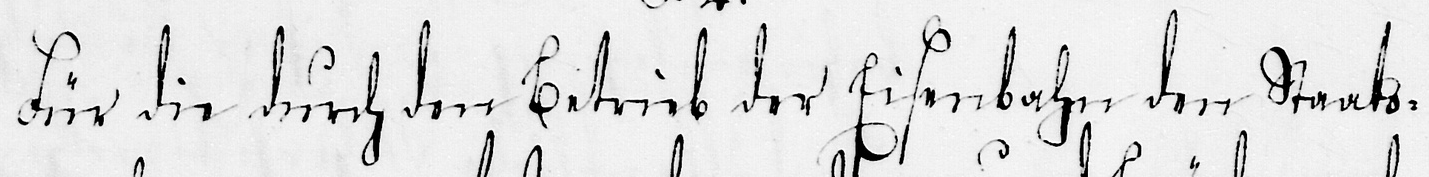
Für die durch den Betrieb der Eisenbahn den Staat¬
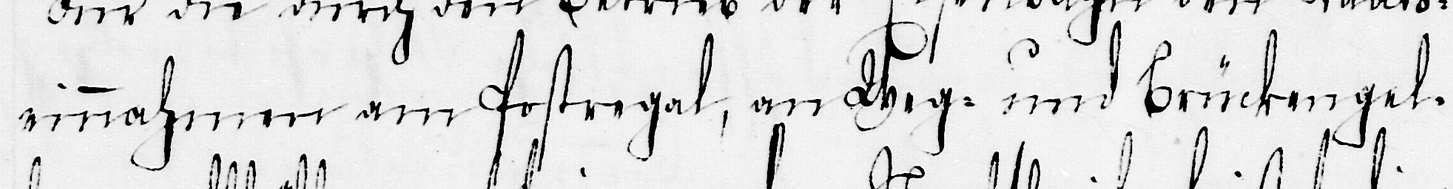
seinnahmen am Postregal, an Weg- und Brückengel¬
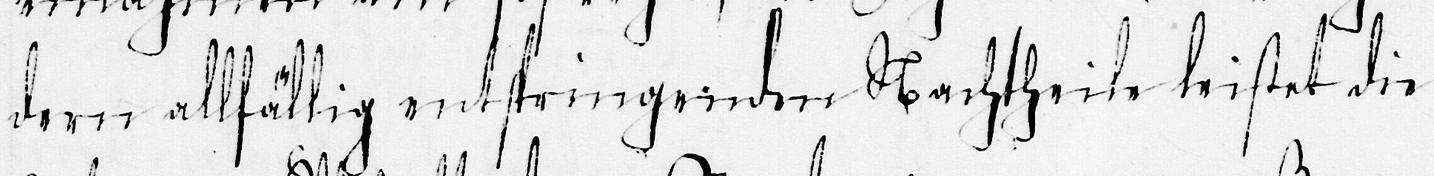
dern allfällig entspringenden Nachtheile leistet die
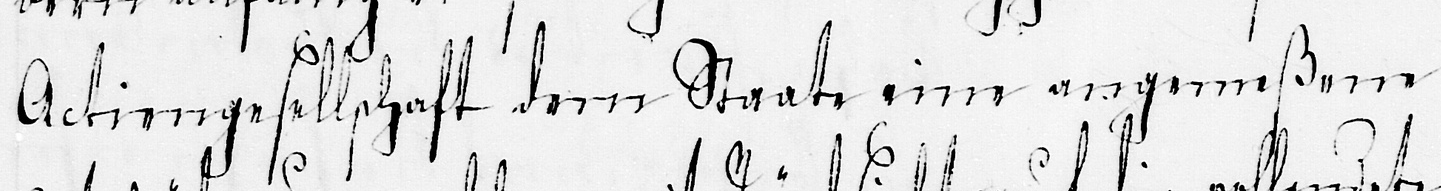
Actiengesellschaft dem Staate eine angemeßene
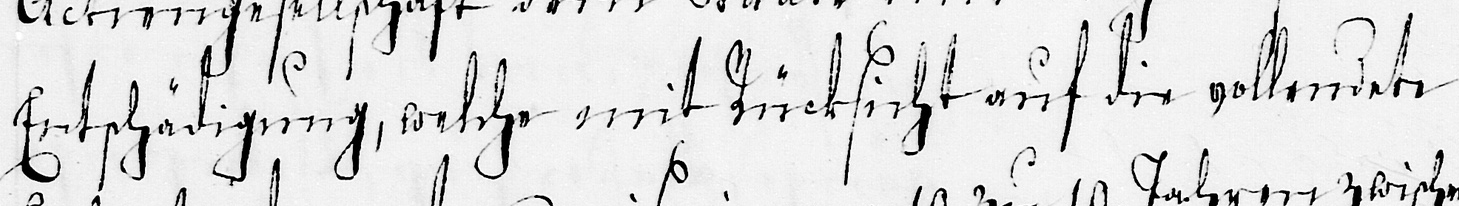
Entschädigung, welche mit Rücksicht auf die vollendete
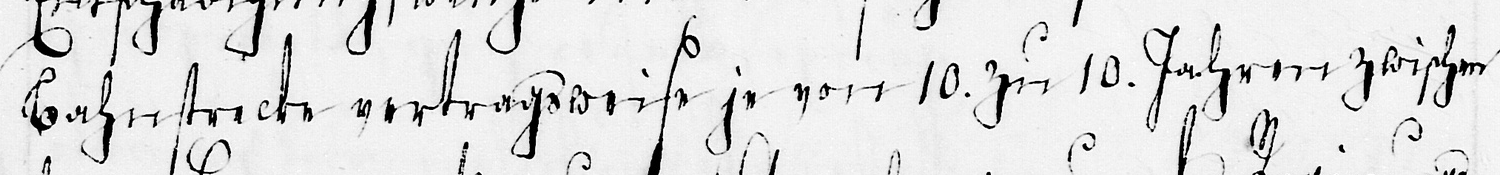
Bahnstrecke vertragsweise je von 10. zu 10. Jahren zwischen
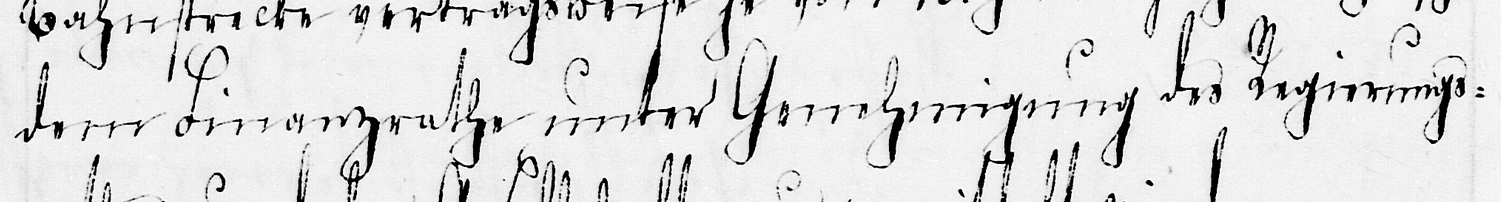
dem Finanzrathe unter Genehmigung des Regierungs¬
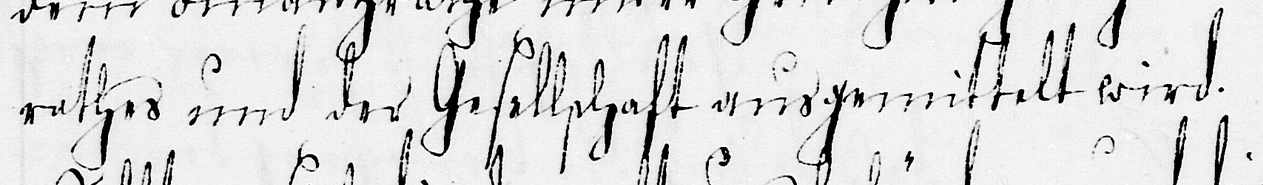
rathes und der Gesellschaft ausgemittelt wird.
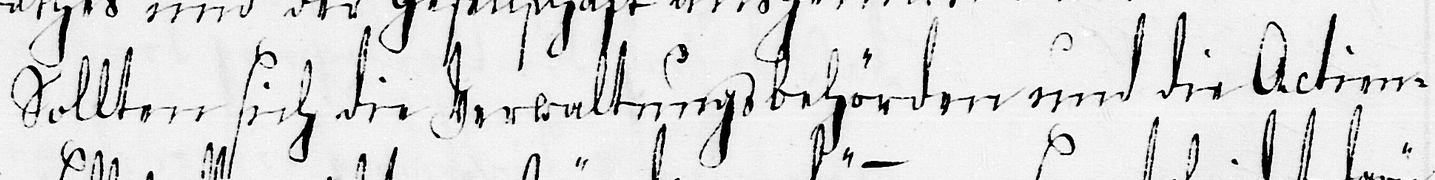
Sollten sich die Verwaltungsbehörden und die Actien¬
